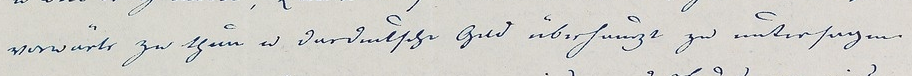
vorwärts zu thun u das deutsche Geld überhaupt zu untersagen.
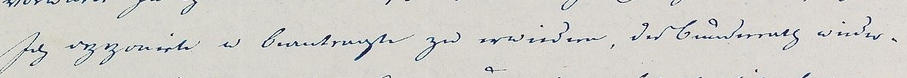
Ich opponirte u beantragte zu erwiedern, der Bundesrath wieder-
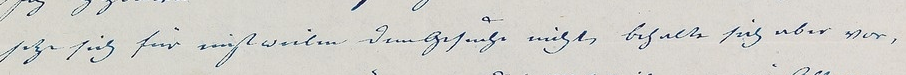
setze sich für einstweilen dem Gesuche nicht, behalte sich aber vor,
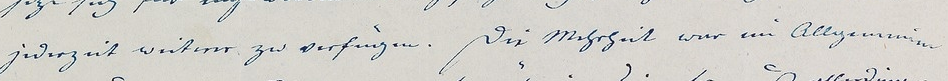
jederzeit weiteres zu verfügen. Die Mehrheit war im Allgemeinen
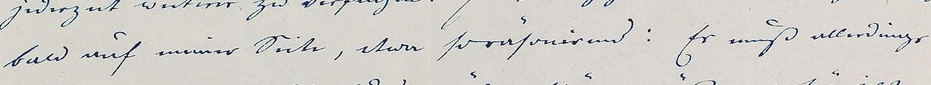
bald auf meiner Seite, etwa so räsonirend: Es muß allerdings
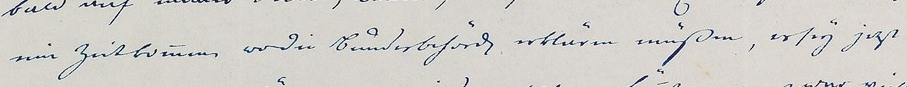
eine Zeit kommen, wo die Bundesbehörden erklären müßen, es sey jetzt
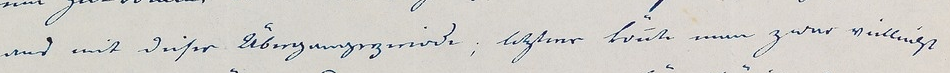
aus mit dieser Übergangsperiode; letzteres könnte man zwar vielleicht
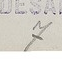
nicht
